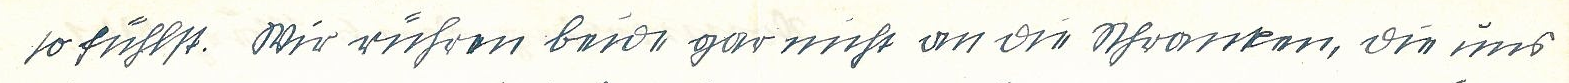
so fühlst. Wir rühren beide gar nicht an die Schranken, die uns
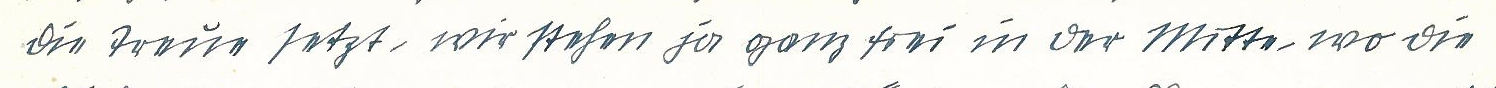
die Treue setzt, wir stehen ja ganz frei in der Mitte, wo die
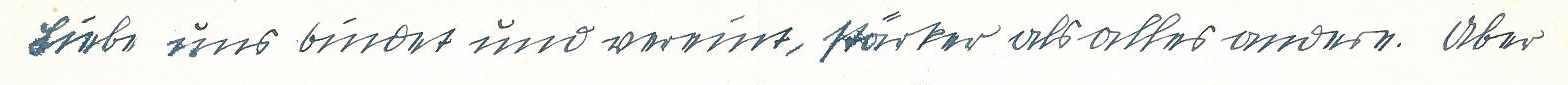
Liebe uns bindet und vereint, stärker als alles andere. Aber
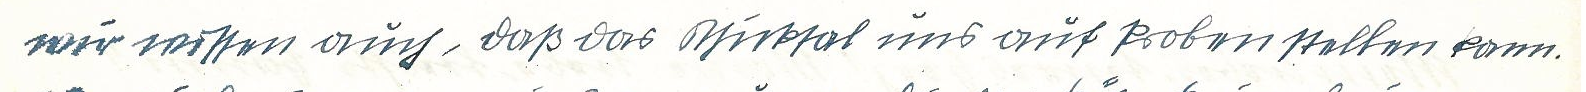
wir wissen auch, daß das Schicksal uns auf Proben stellen kann.
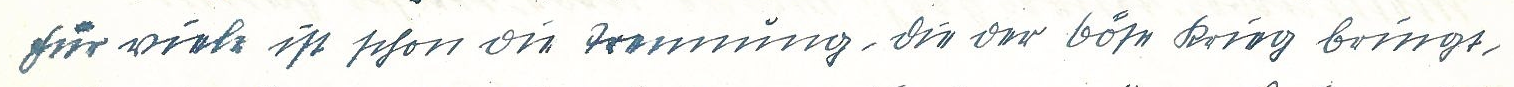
Für viele ist schon die Trennung, die der böse Krieg bringt,
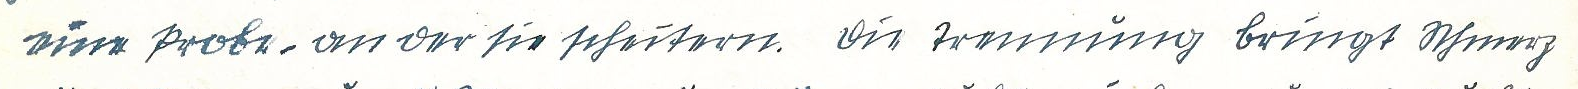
eine Probe, an der sie scheitern. Die Trennung bringt Schmerz
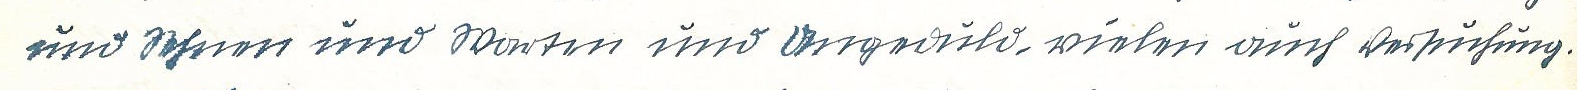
und Sehnen und Warten und Ungeduld, vielen auch Versuchung.
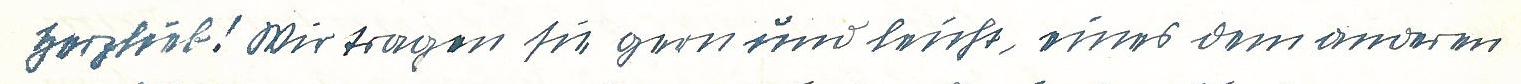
Herzlieb! Wir tragen sie gern und leicht, eines dem anderen
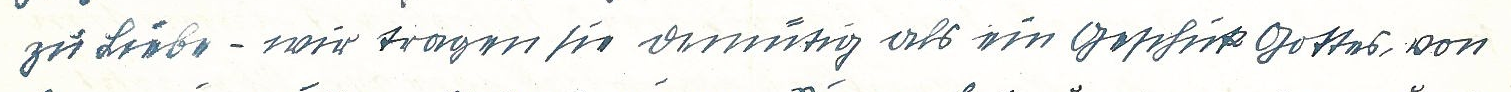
zu Liebe – wir tragen sie demütig als ein Geschick Gottes, von
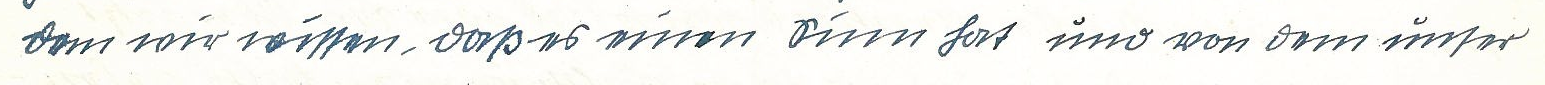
dem wir wissen, daß es einen Sinn hat und von dem unser
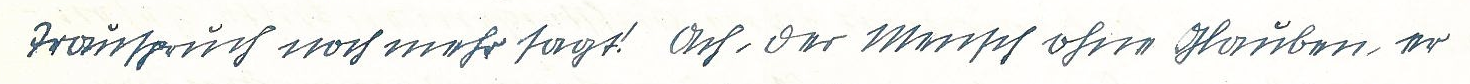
Trauspruch noch mehr sagt! Ach, der Mensch ohne Glauben, er
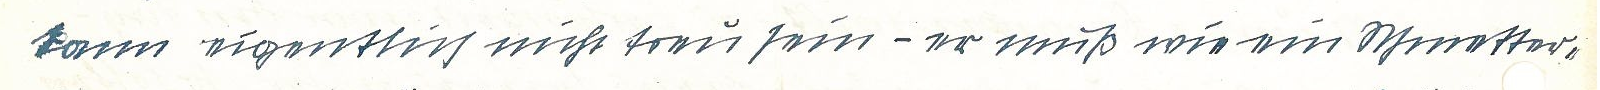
kann eigentlich nicht treu sein – er muss wie ein Schmetter¬
